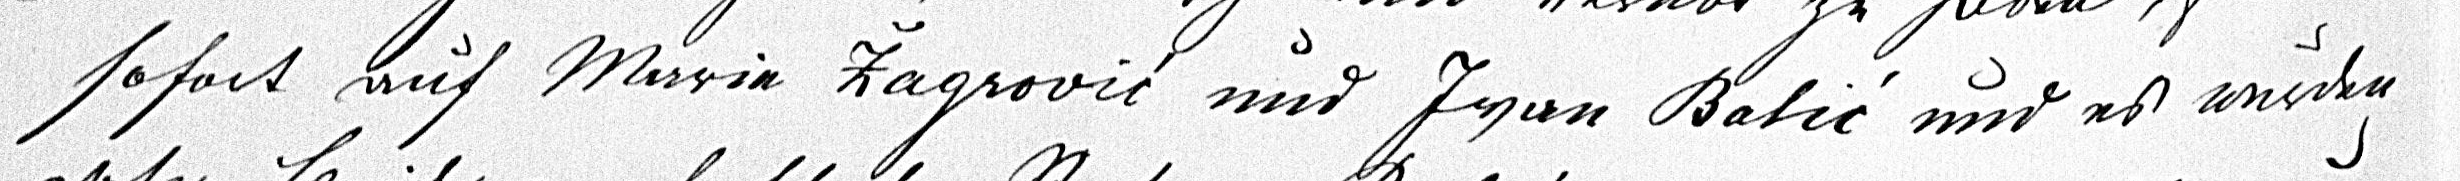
sofort auf Marie Zagrović und Ivan Balić und es wurden
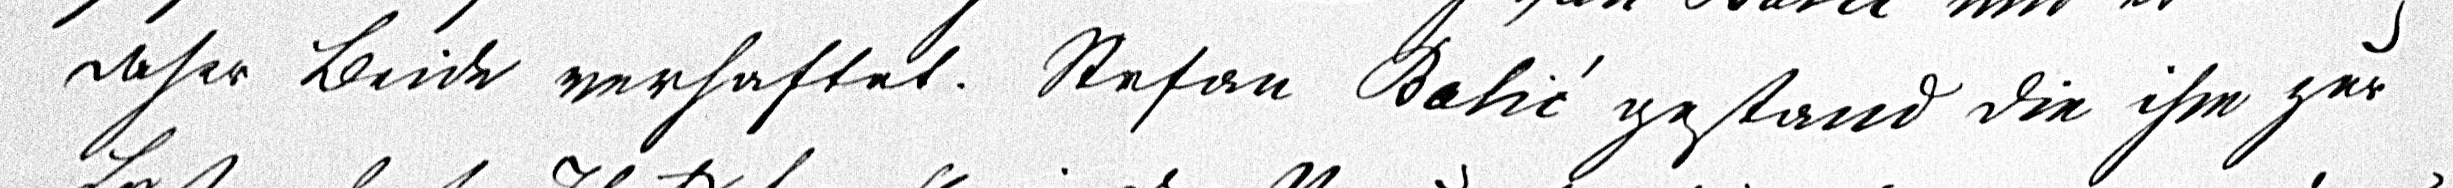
daher Beide verhaftet. Stefan Balić gestand die ihm zur
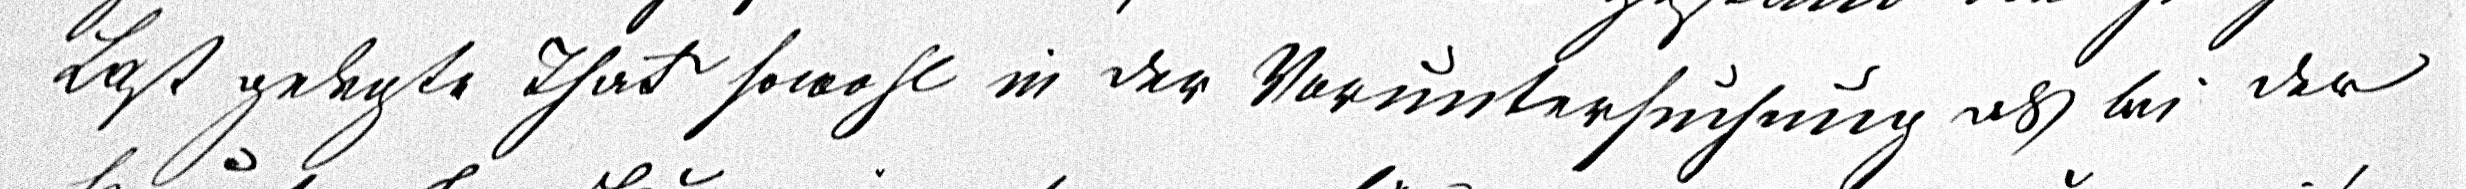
Last gelegte That sowohl in der Voruntersuchung als bei der
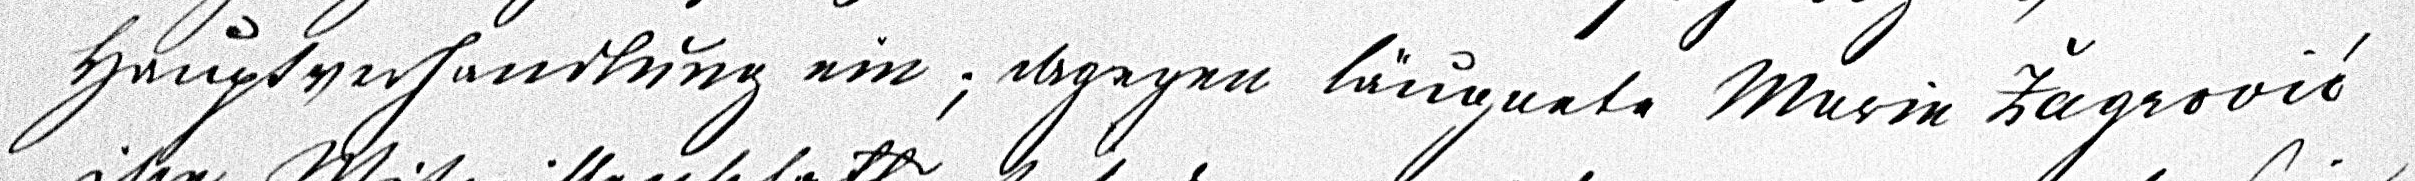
Hauptverhandlung ein; dagegen läugnete Marie Zagrović
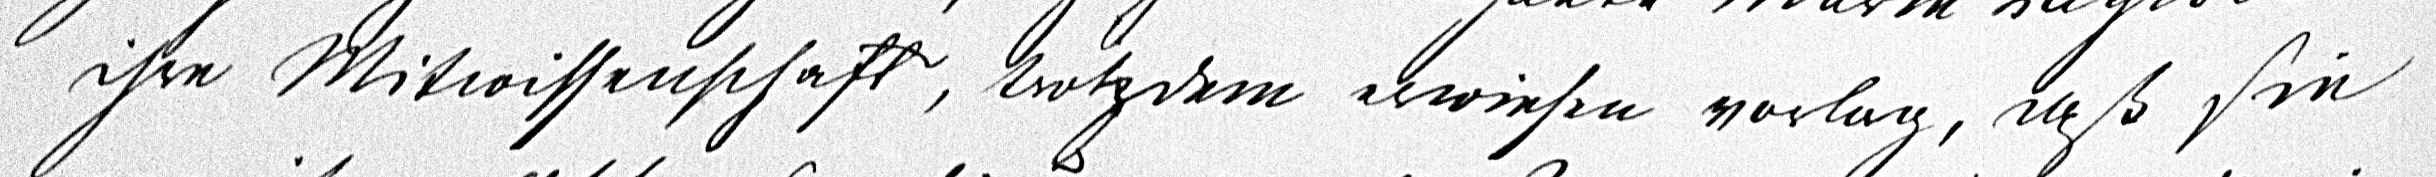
ihre Mitwissenschaft, trotzdem erwiesen vorlag, daß sie
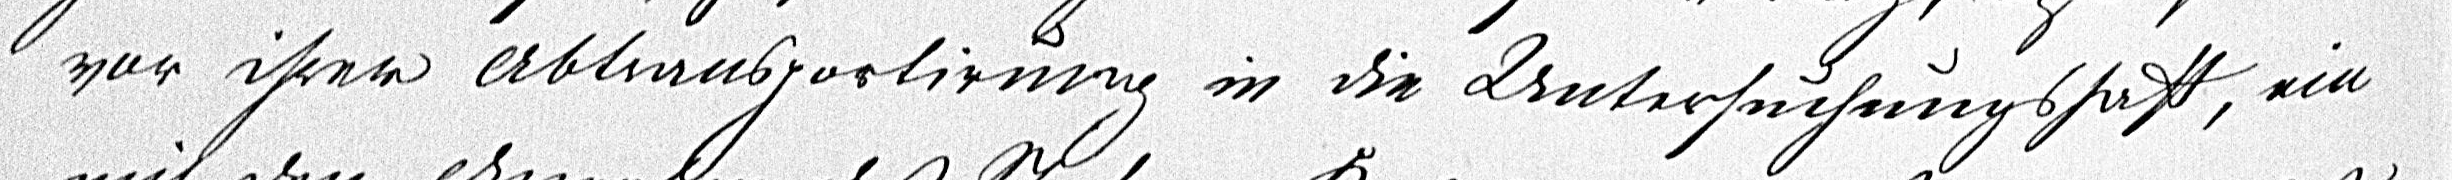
vor ihrer Abtransportirung in die Untersuchungshaft, ein
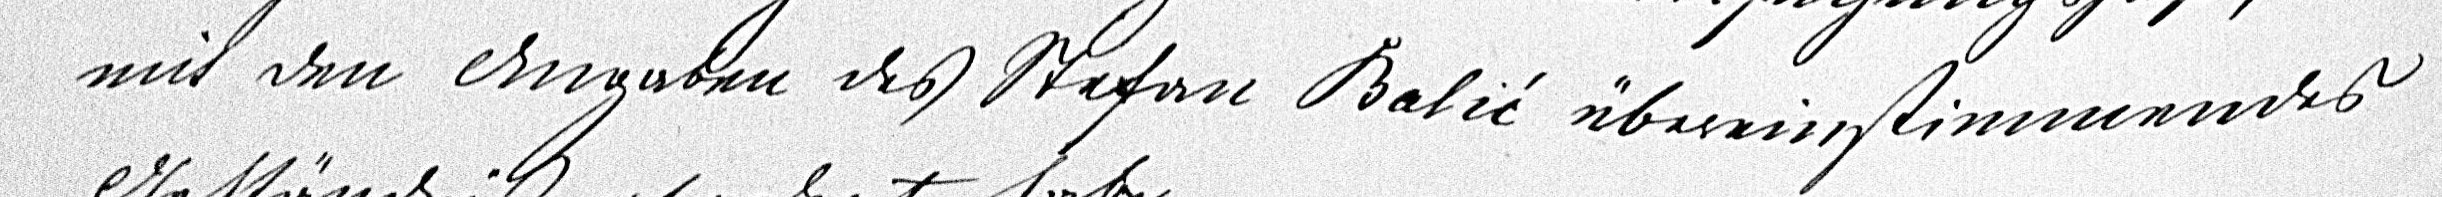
mit den Angaben des Stefan Balić übereinstimmendes
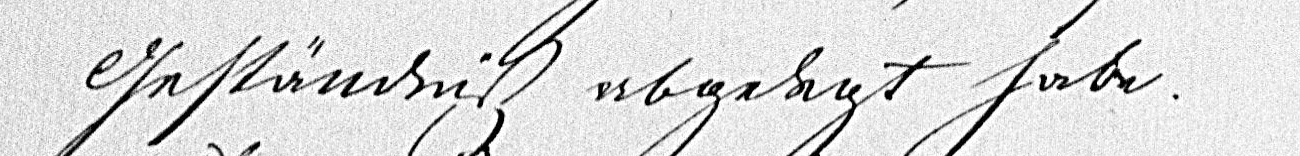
Geständnis abgelegt habe.
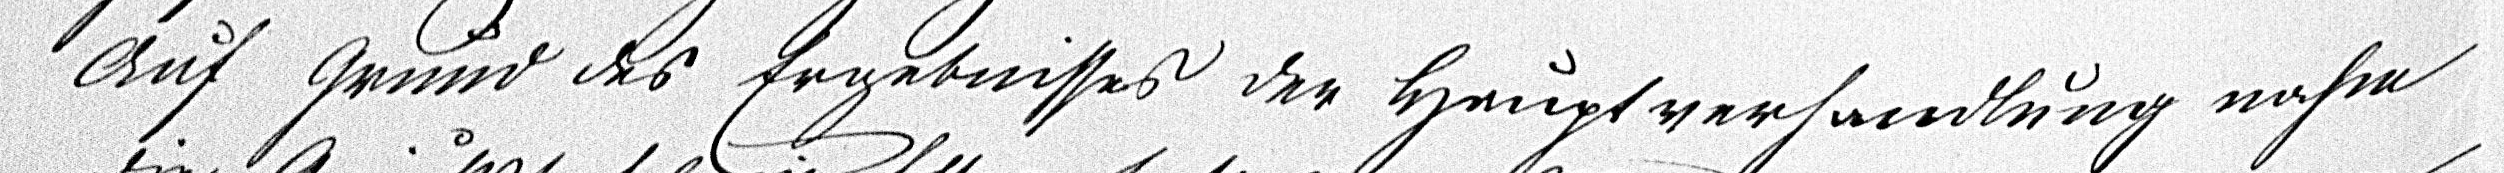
Auf Grund des Ergebnisses der Hauptverhandlung nahm
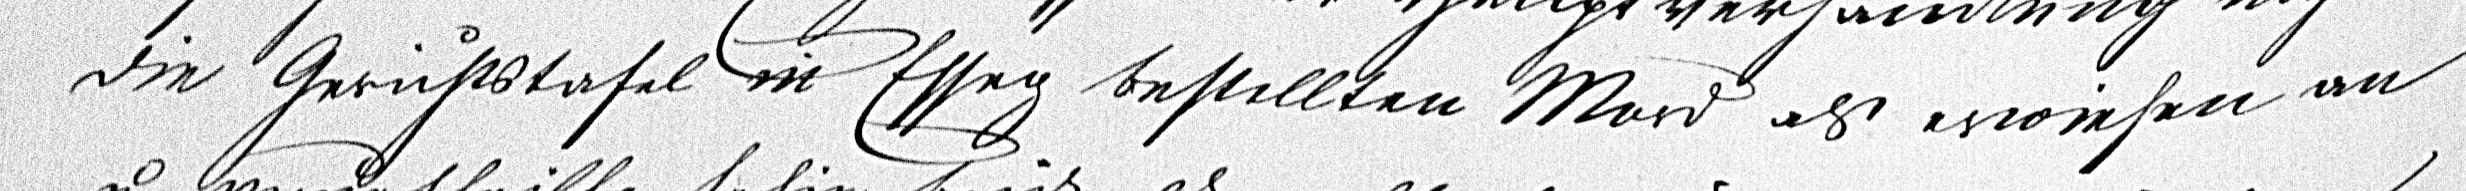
die Gerichtstafel in Esseg bestellten Mord als erwiesen an
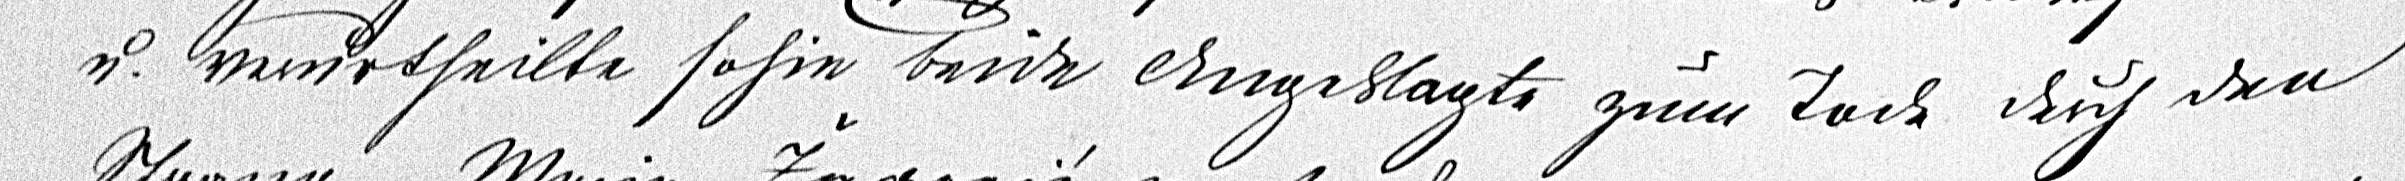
u. verurtheilte sohin beide Angeklagte zum Tode durch den
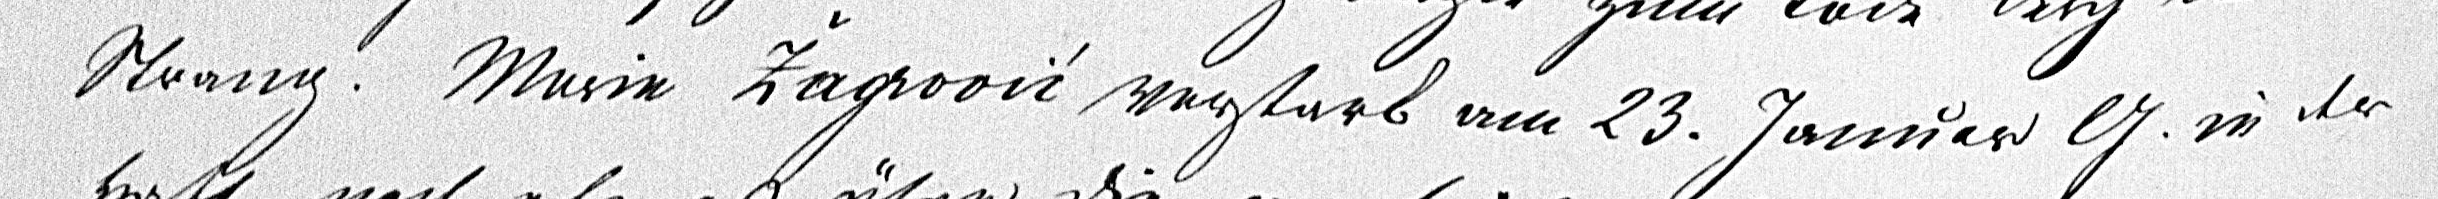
Strang. Marie Zagrović verstarb am 23. Januar G. in der
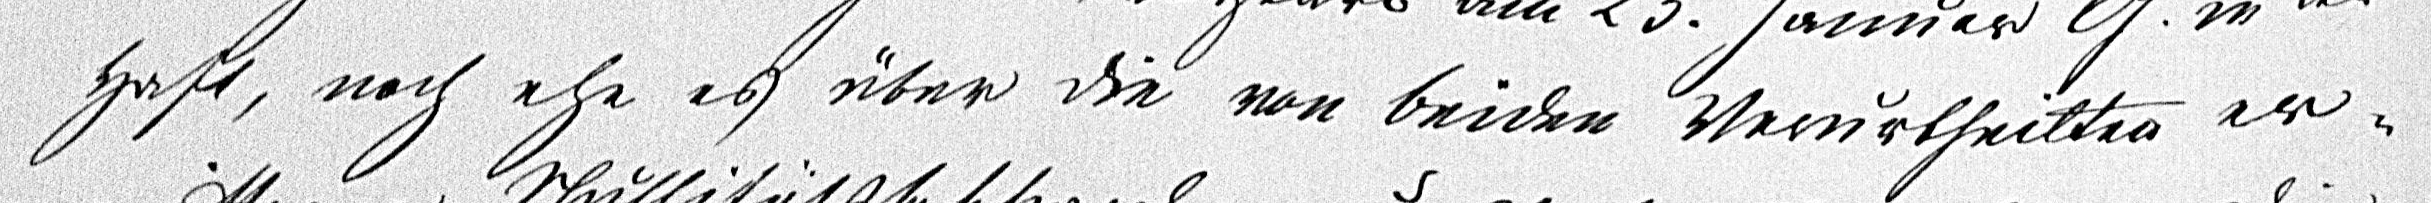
Hast, nach ehe es über die von beiden Verurtheilten er¬
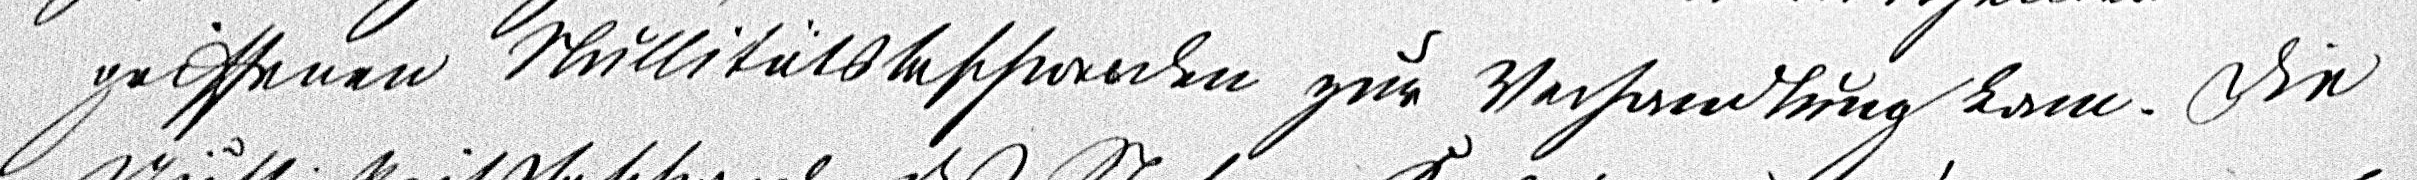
griffenen Nullitätsxxschwerden zur Verhandlung kam. Die
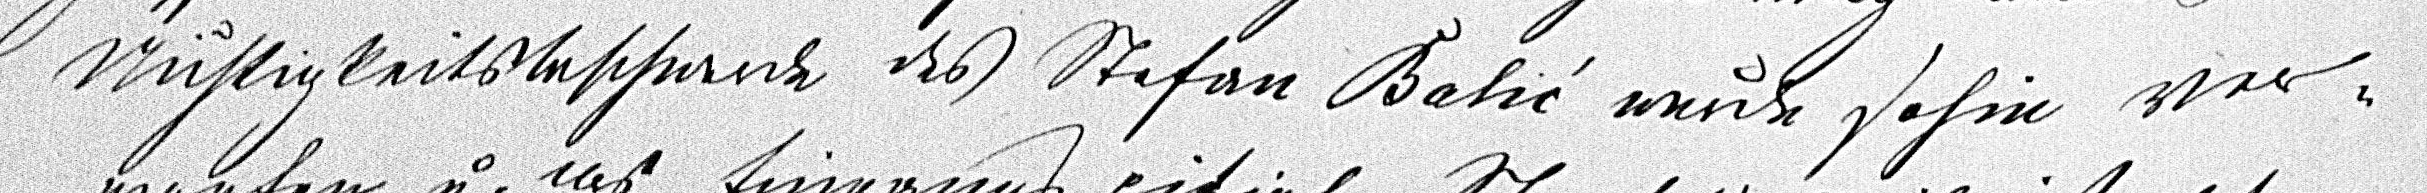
Nichtigkeitsbeschwerde des Stefan Balić wurde sohin ver¬
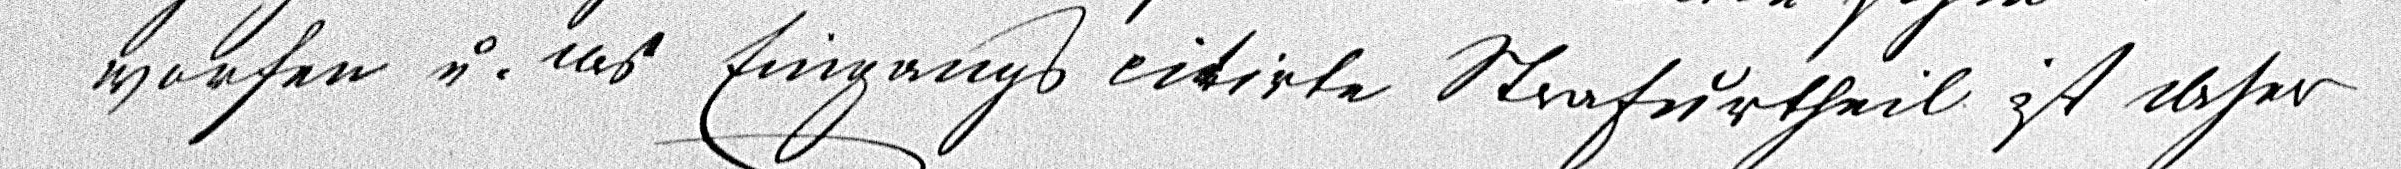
worfen u. des Eingangs citirte Strafurtheil ist daher
